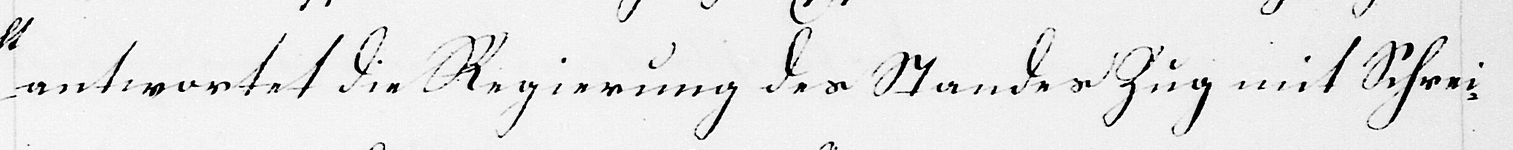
antwortet die Regierung des Standes Zug mit Schrei¬
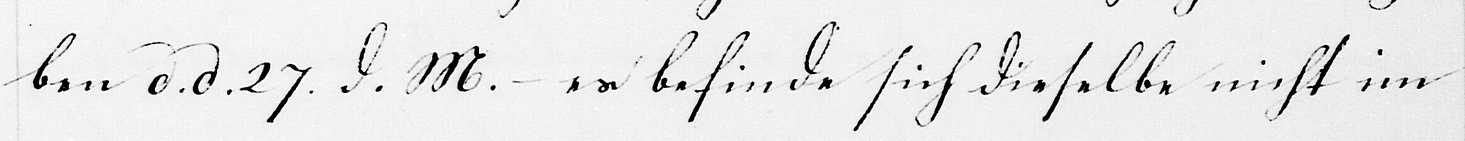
ben d. d. 27. d. M. es befinde sich dieselbe nicht im
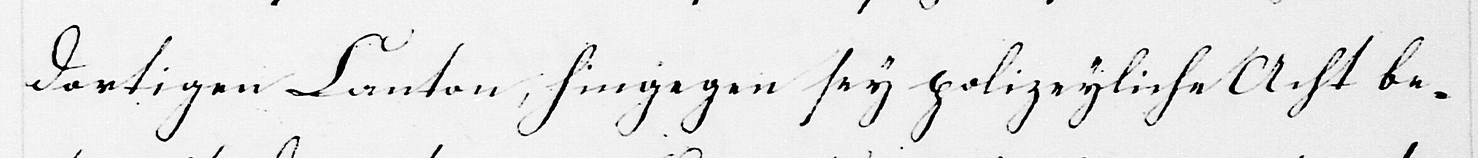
dortigen Canton, hingegen sey polizeyliche Acht be¬
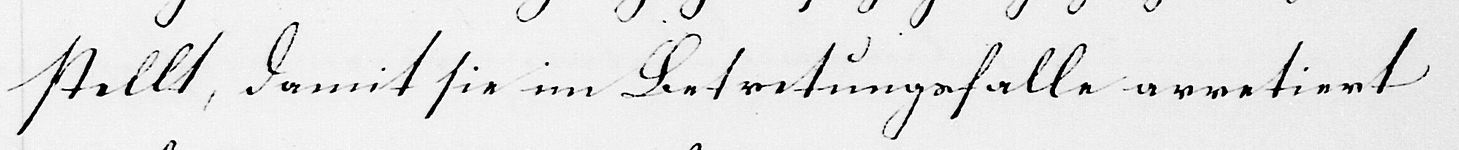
stellt, damit sie im Betretungsfalle arretiert
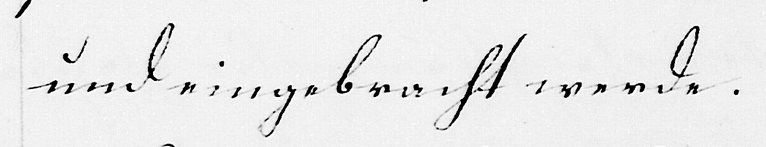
und eingebracht werde.
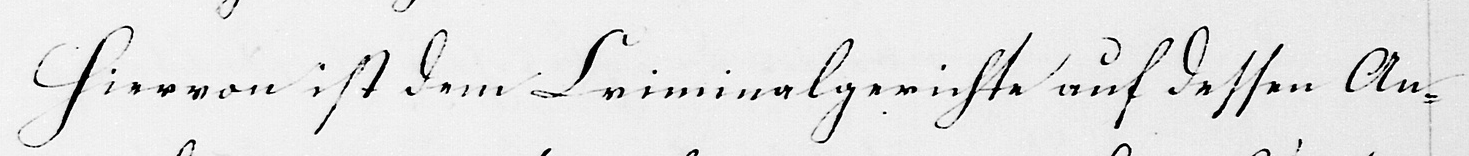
Hiervon ist dem Criminalgerichte auf dessen An¬
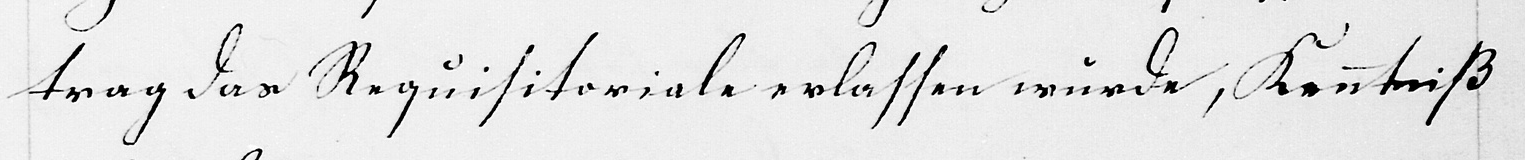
trag das Requisitoriale erlassen wurde, Kenntniß
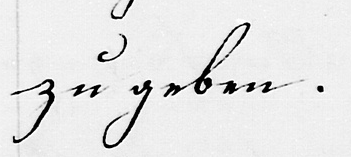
zu geben.
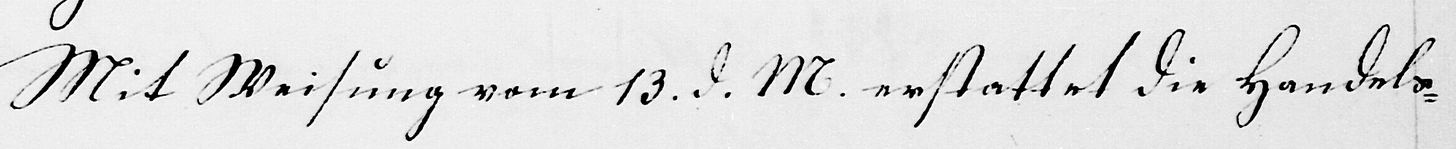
Mit Weisung vom 13. d. M. erstattet die Handel¬
